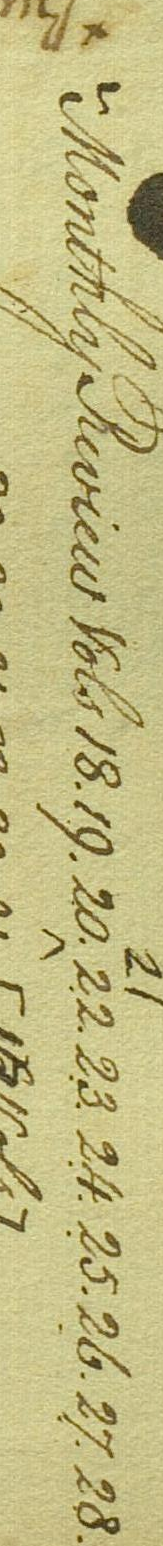- Monthly Review Vols 18. 19. 20. ^21 22. 23. 24. 25. 26. 27. 28.
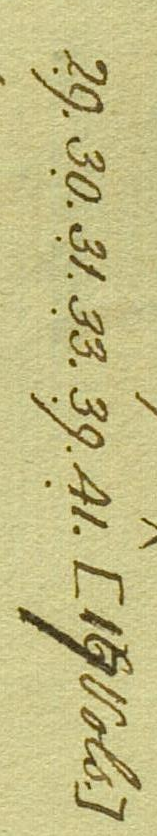29.30. 31.33. 39. 41. (17 Vols.)
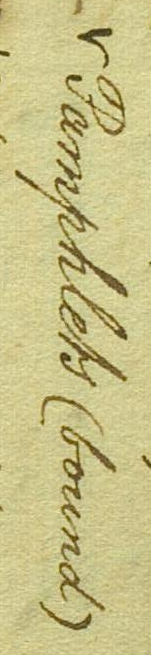- Pamphlets (bound)
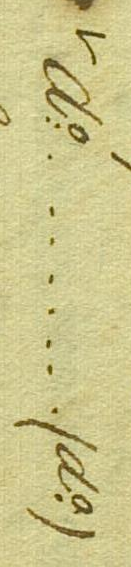- d^o. . . . . . . (d^o)
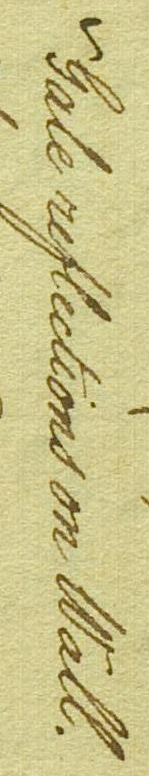- Gale reflections on Wall.
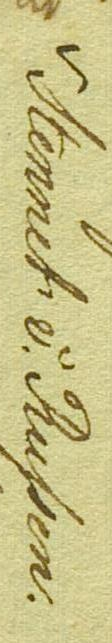- Stennet v. Russen.
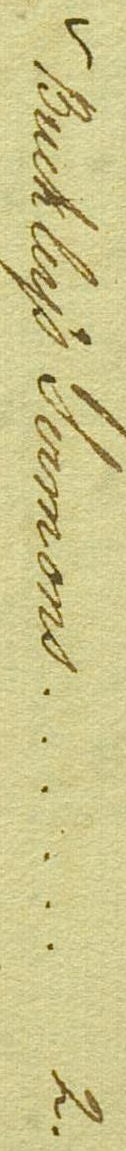- Buckley's Sermons. . . . . . 2.
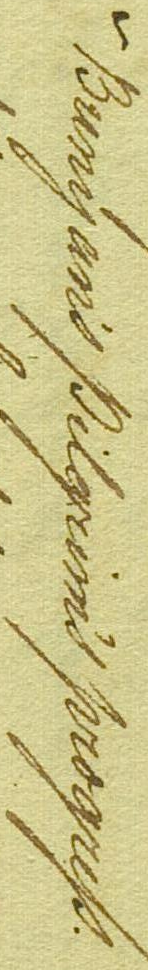- Bunyan's Pilgrim's progress.
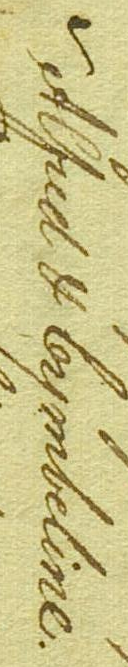- Alfred & Cymbeline.
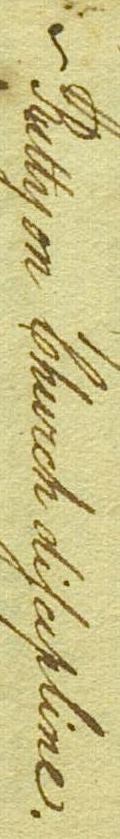- Retty on Church discipline.
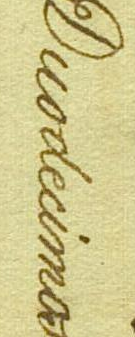Duodecimos
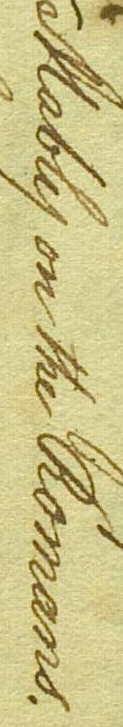- Mably on the Romans.
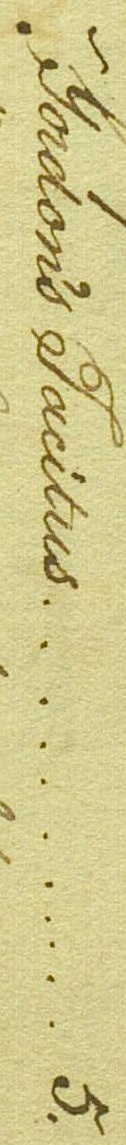- Gordon's Tacitus..........5.
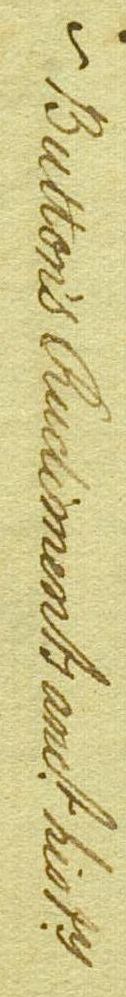- Button's Rudiments anc^t. hist^y.
